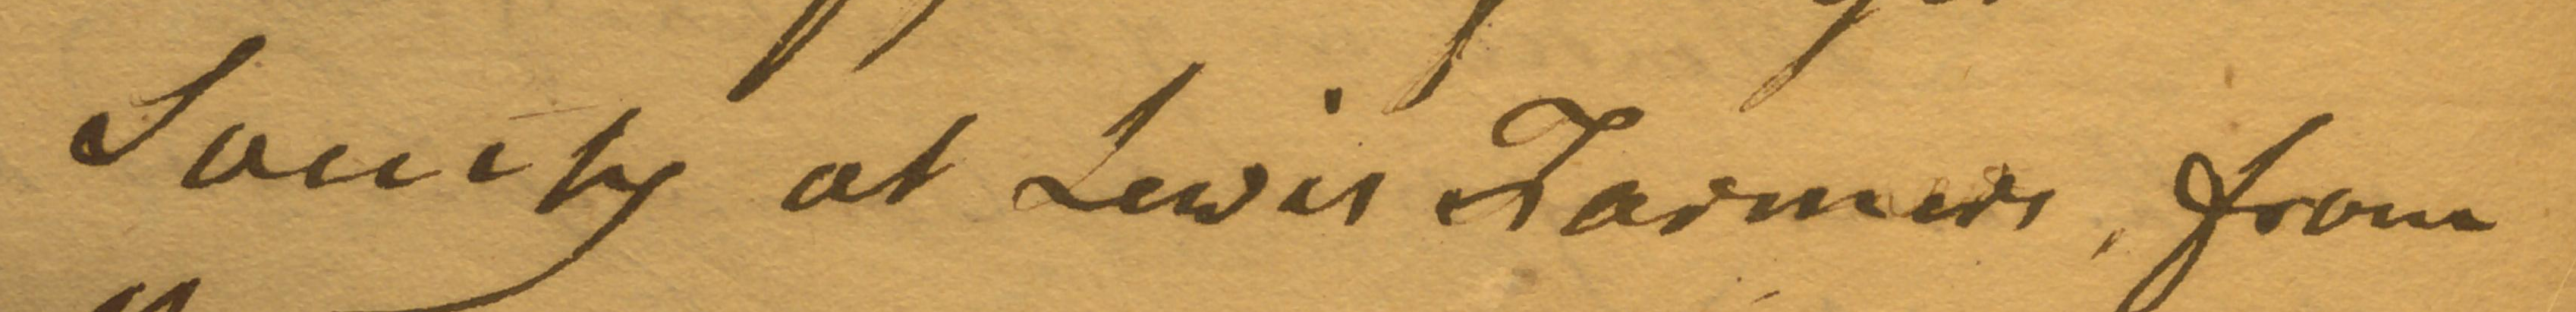Society at Lewis Farmers, from
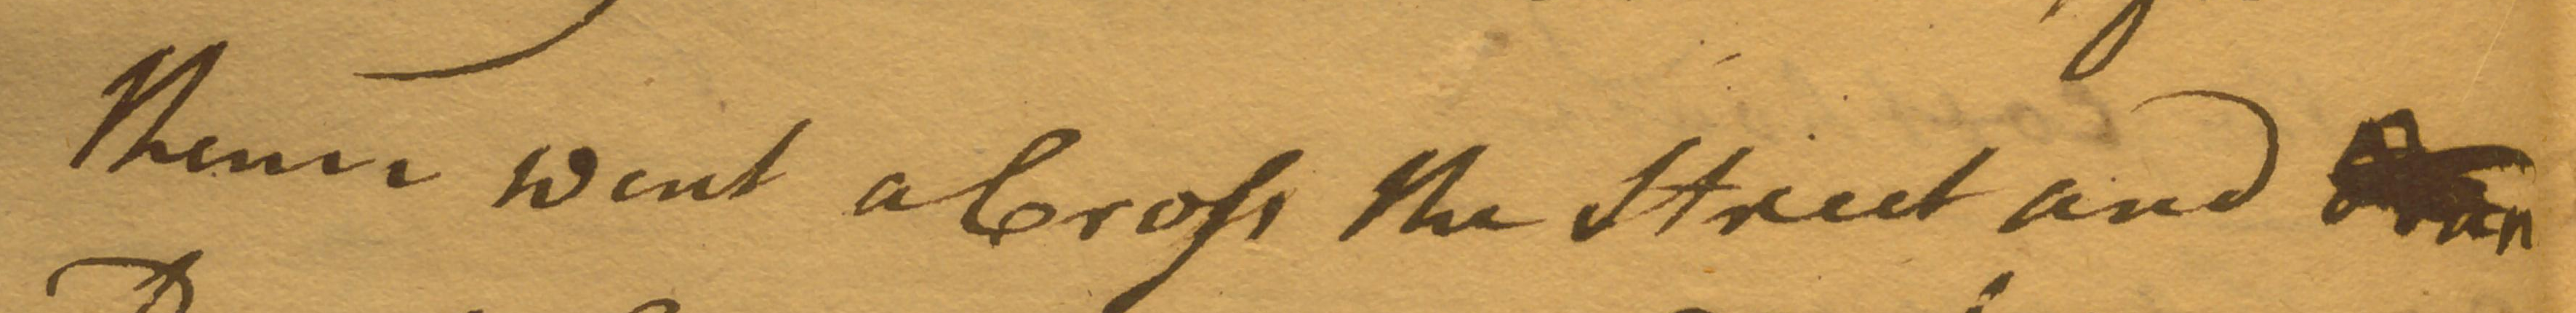thence went a Cross the Street and [dran]
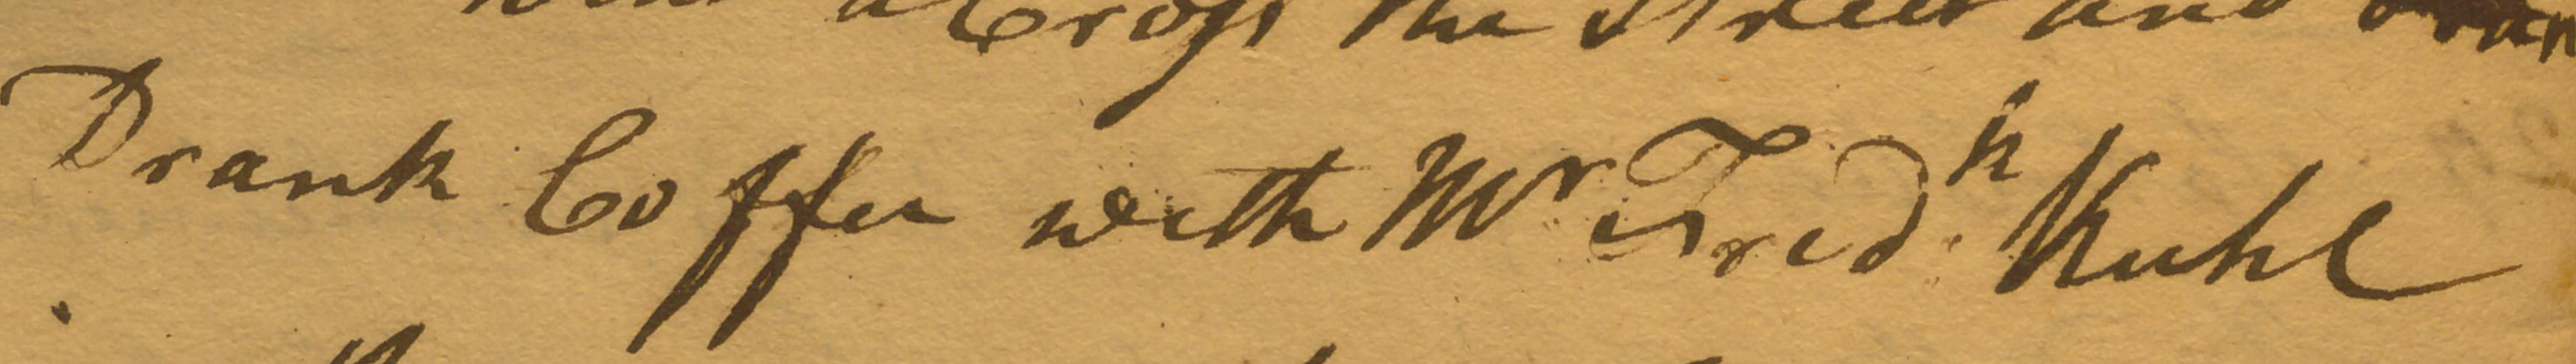Drank Coffee with M^r. Fred^k. Kuhl
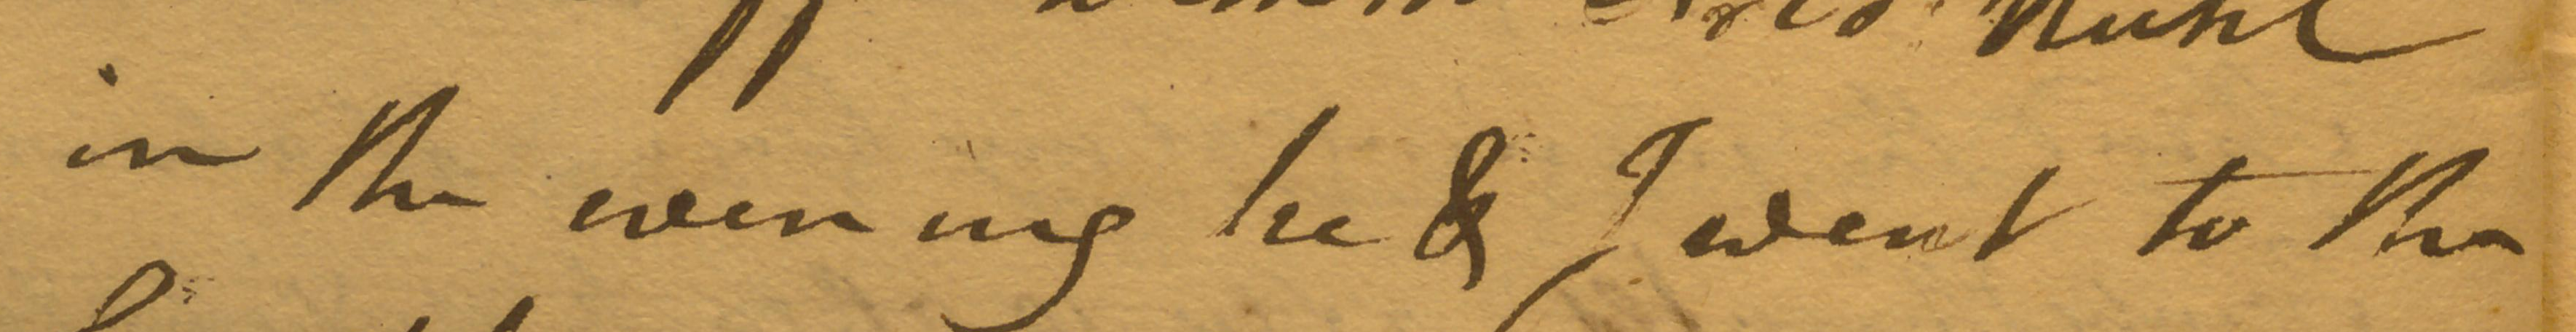in the evening he & I went to the
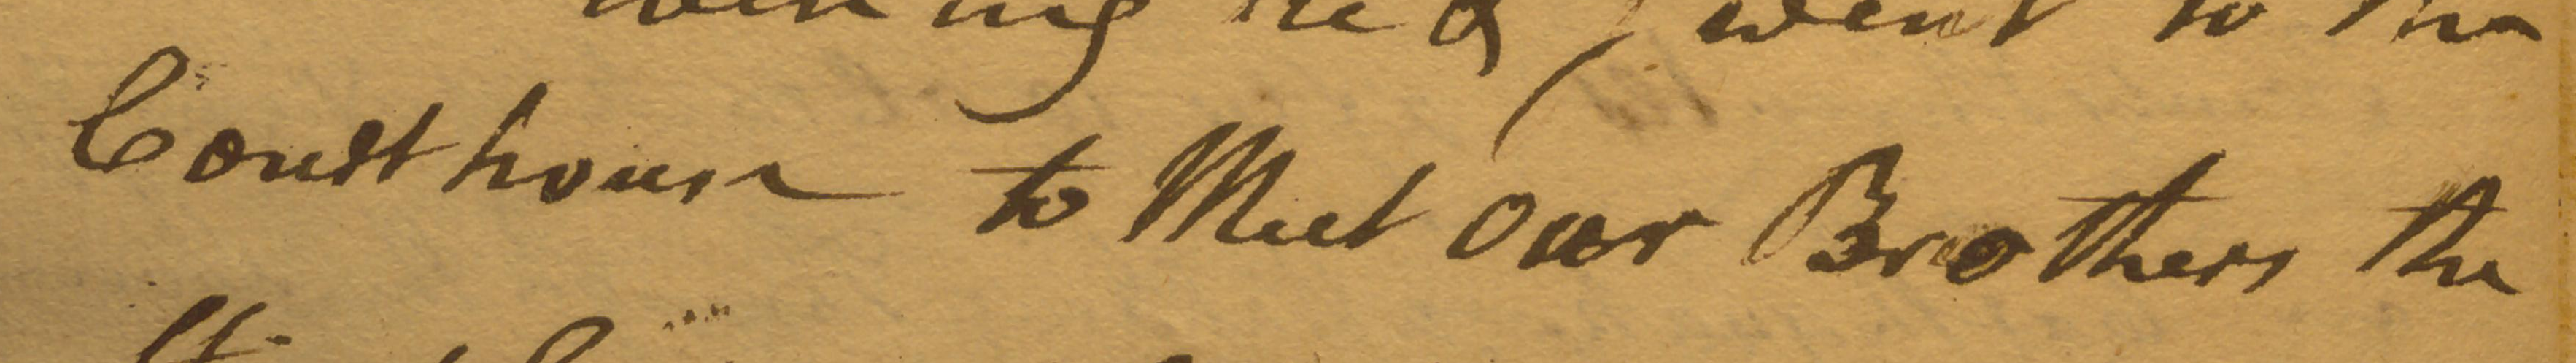Coutthour to Meet our Brothers the
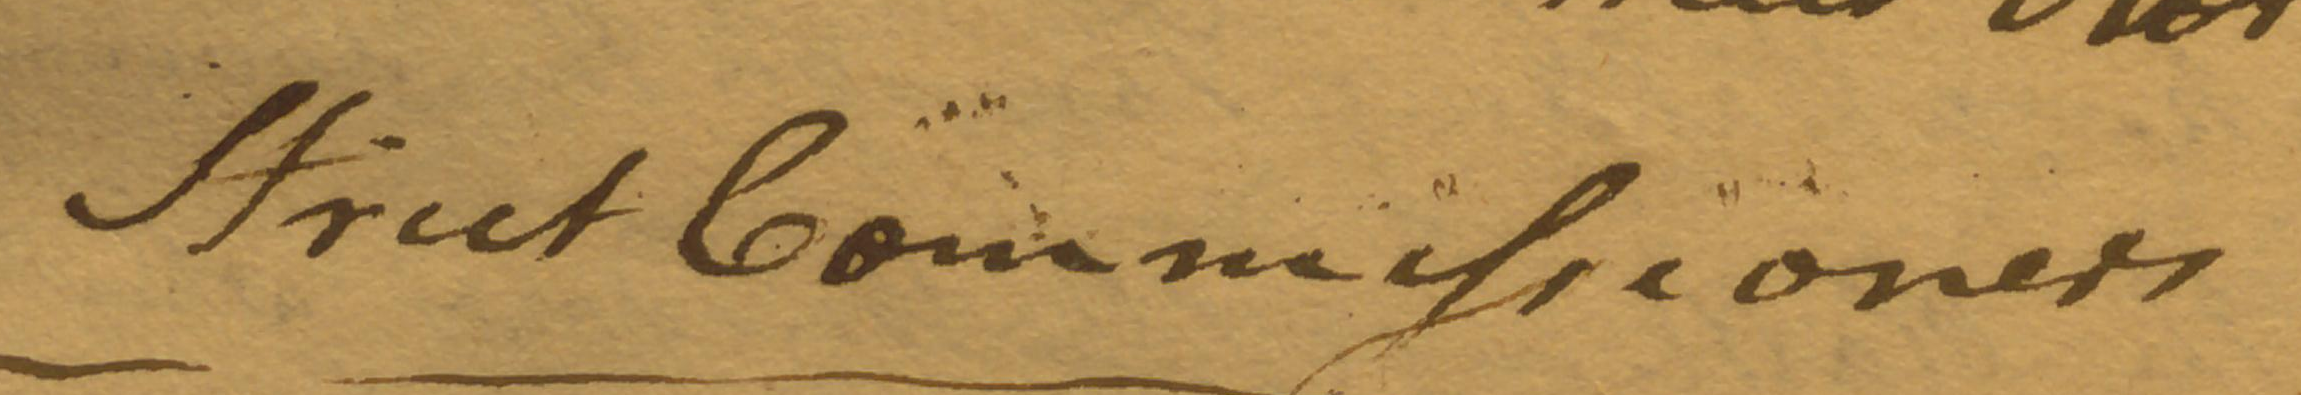Street Commissioners
